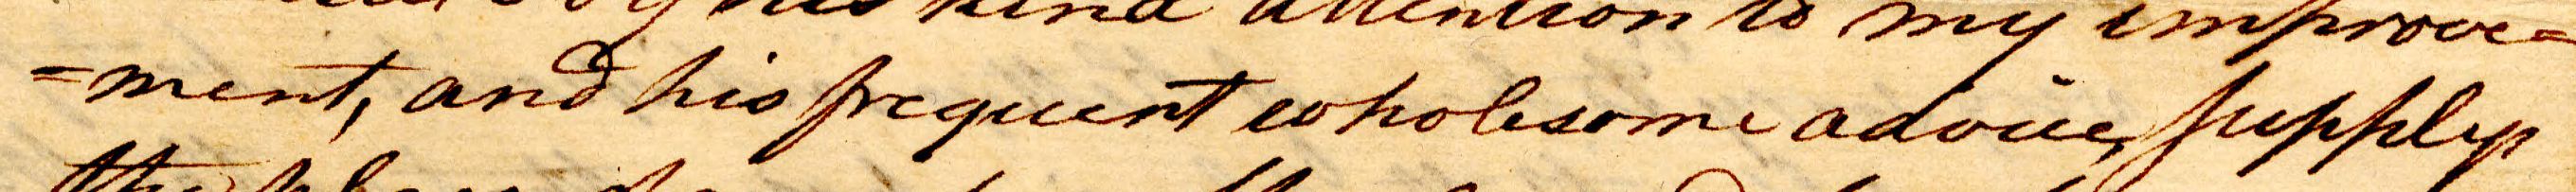-ment, and his frequent wholesome advice, supply
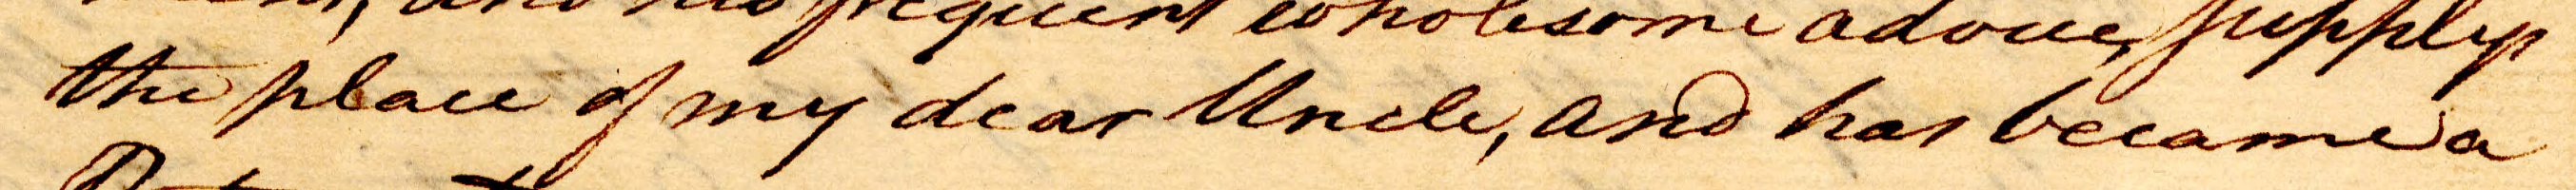the place of my dear Uncle, and has become a
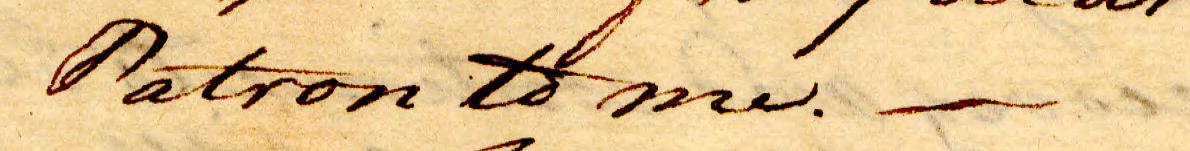Patron to me.-
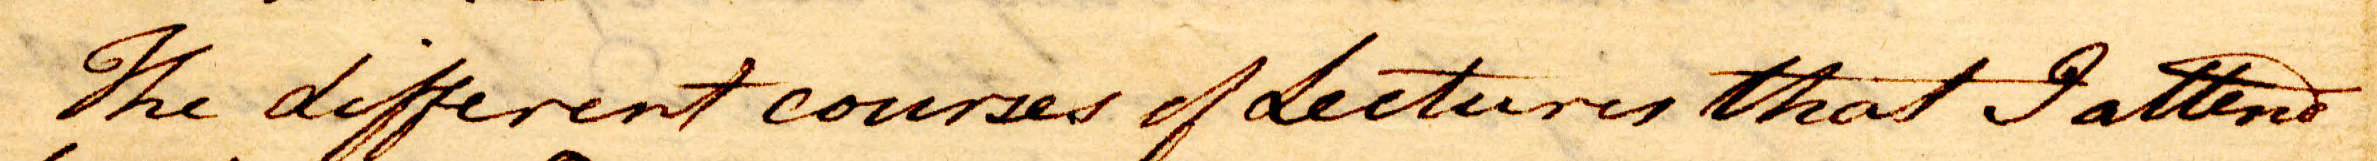The different courses of Lectures that I attend
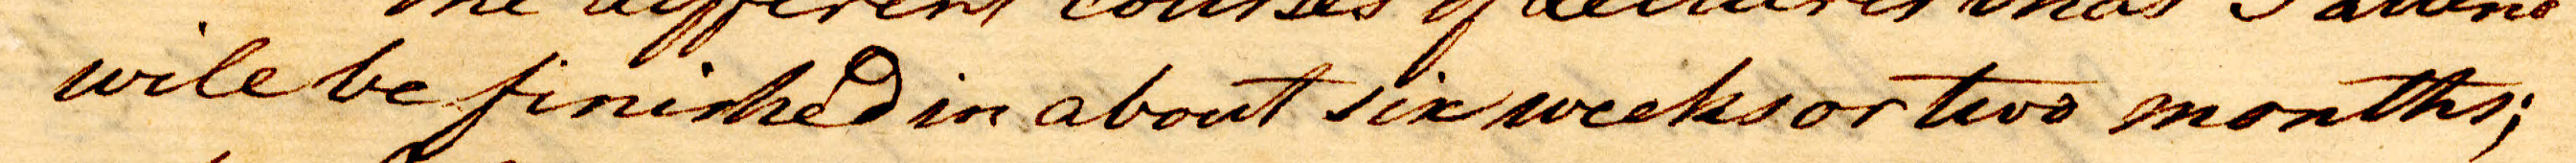will be finished in about six weeks or two months;
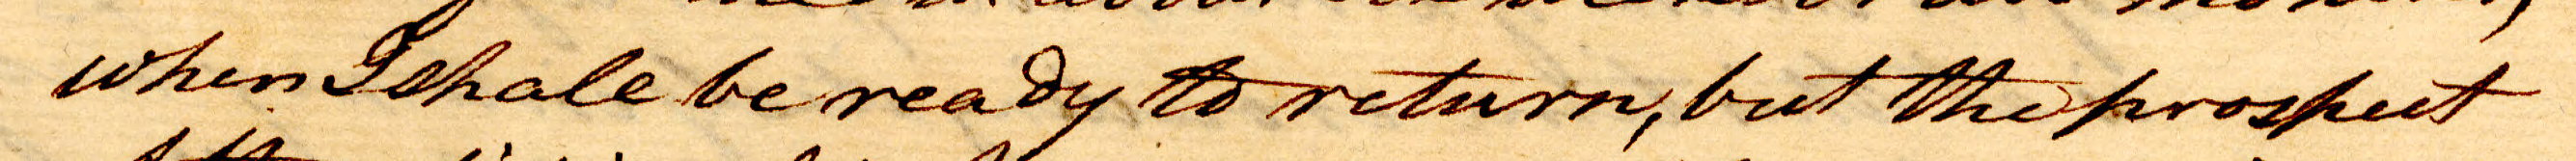when I shall be ready to return, but the prospect
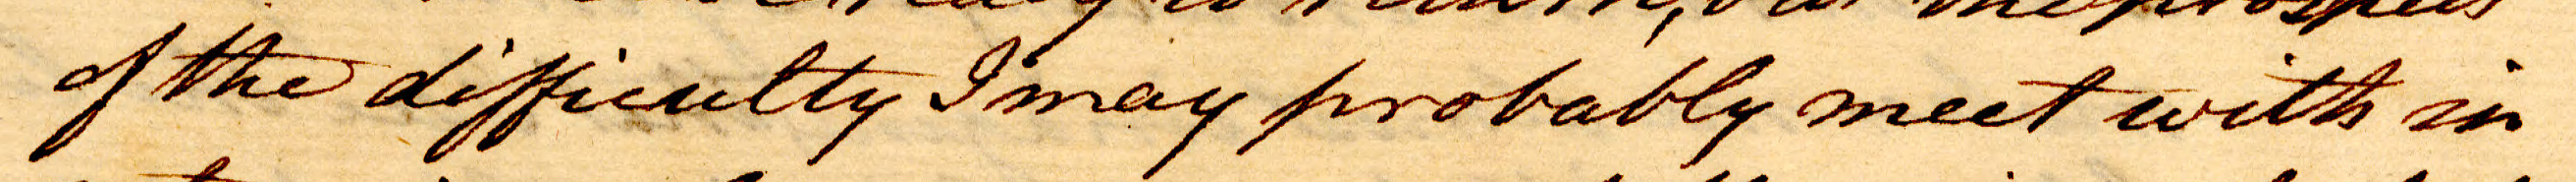of the difficulty I may probably meet with in
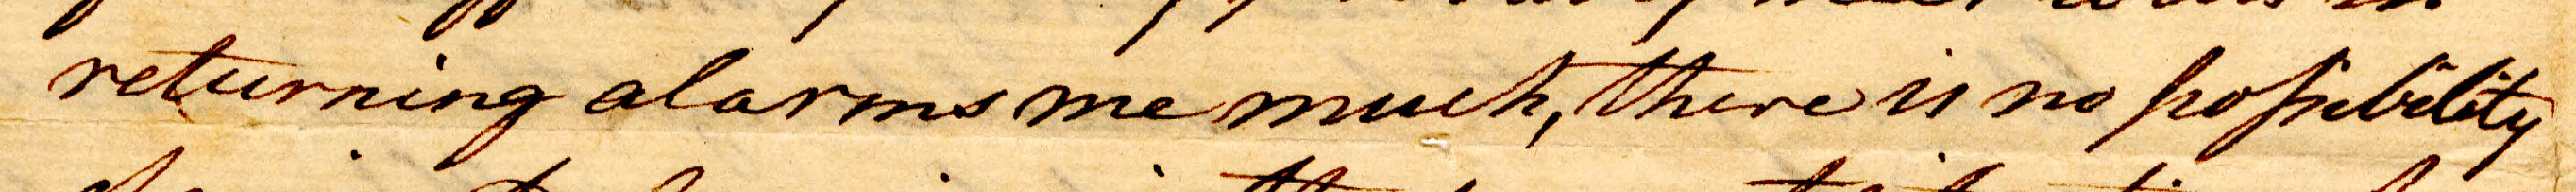returning alarms me much, there is no possibility
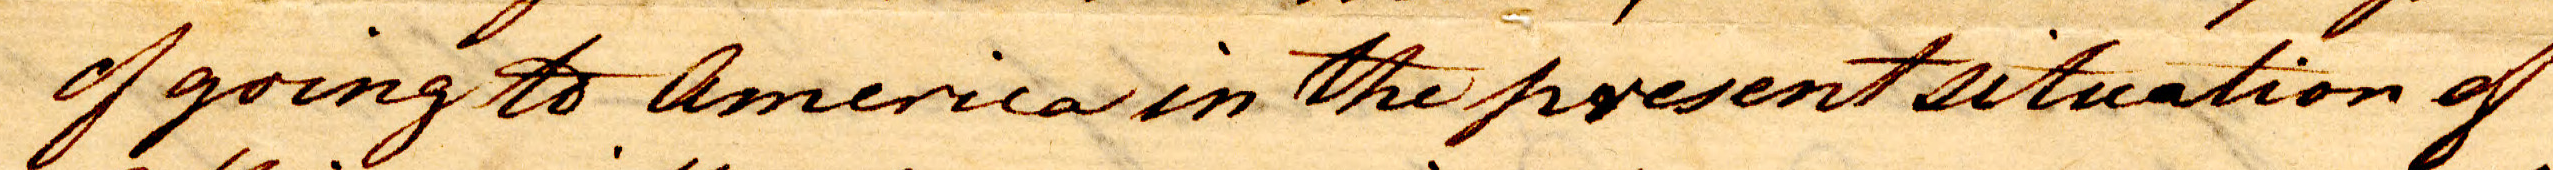of going to America in the present situation of
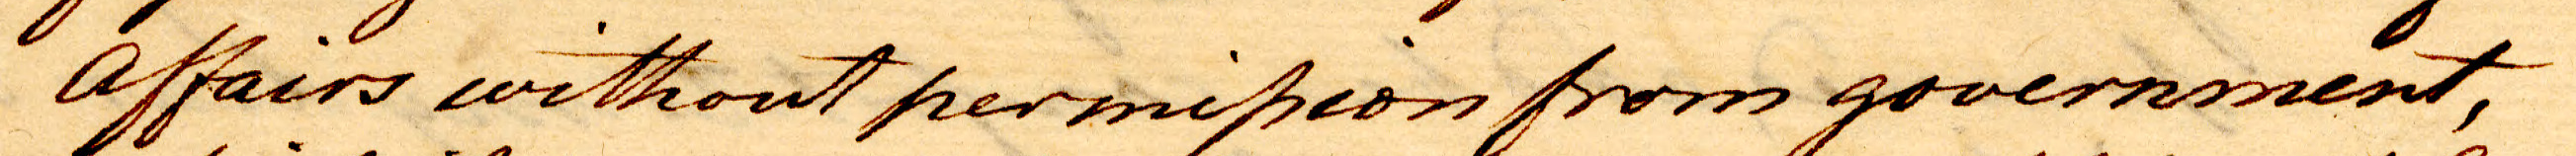Affairs without permission from government,
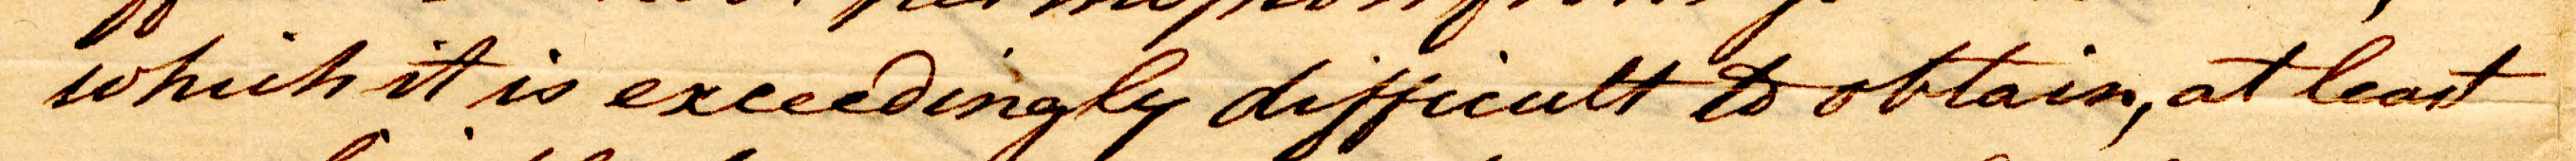which it is exceedingly difficult to obtain, at least
